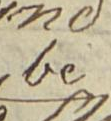be
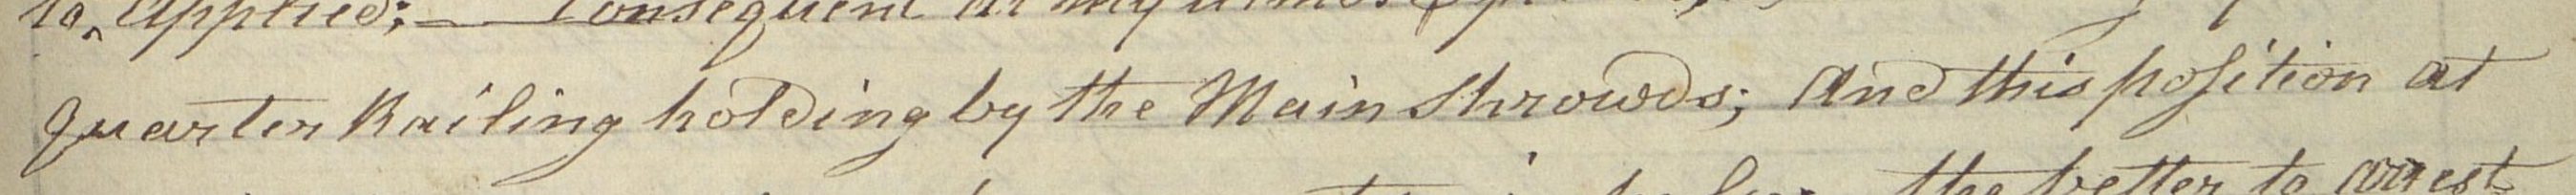quarter Railing holding by the Main Shrouds; And this position at
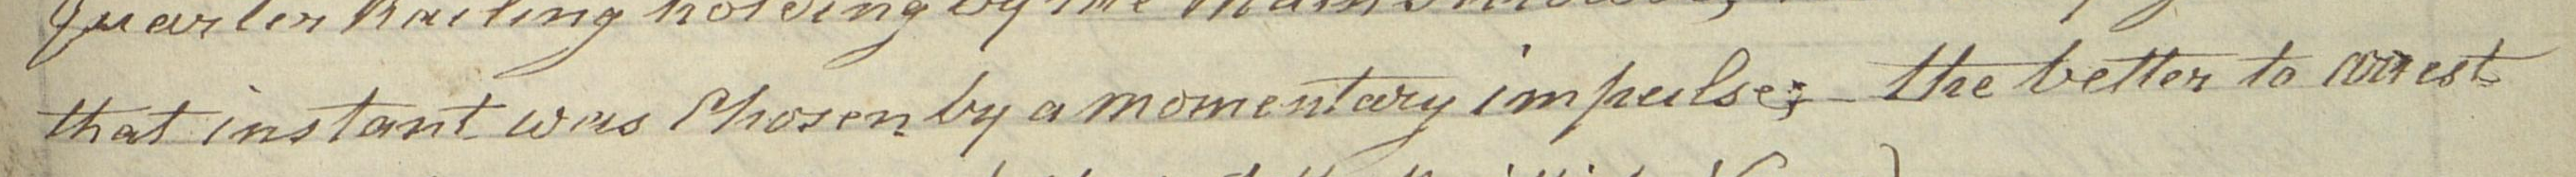that instant was chosen by a momentary impulse; the better to arrest
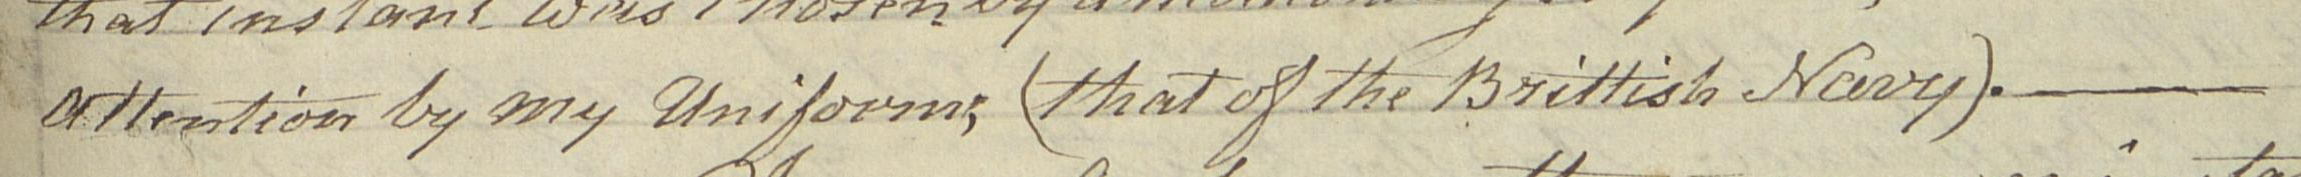Attention by my Uniform; (that of the Brittish Navy).
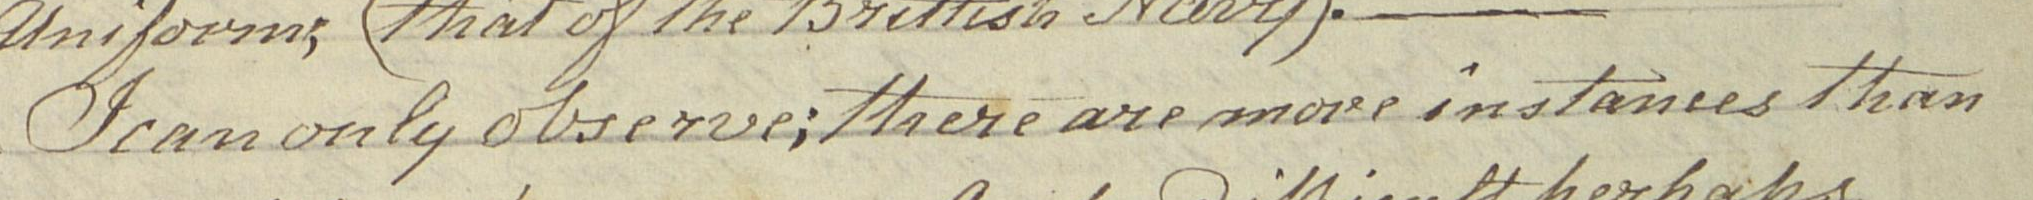I can only observe; there are more instances than
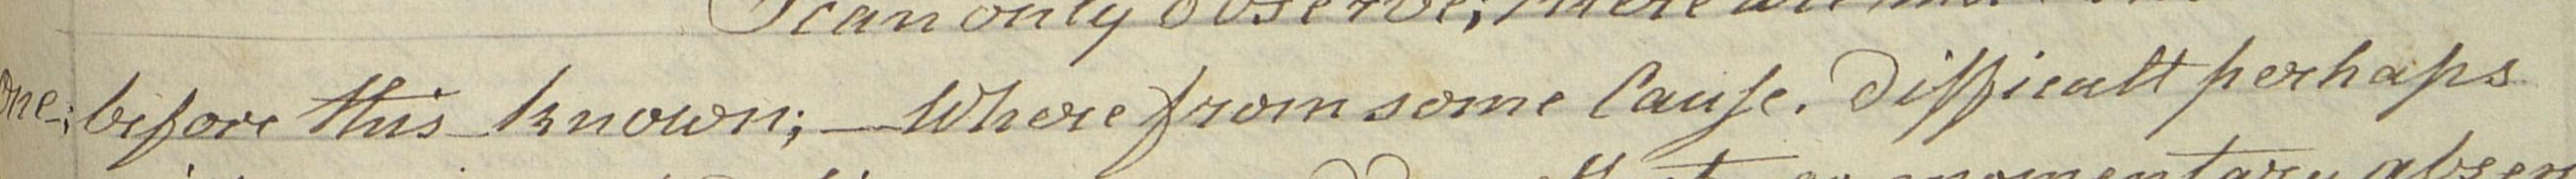One; before this known; Where from some Cause, difficult perhaps
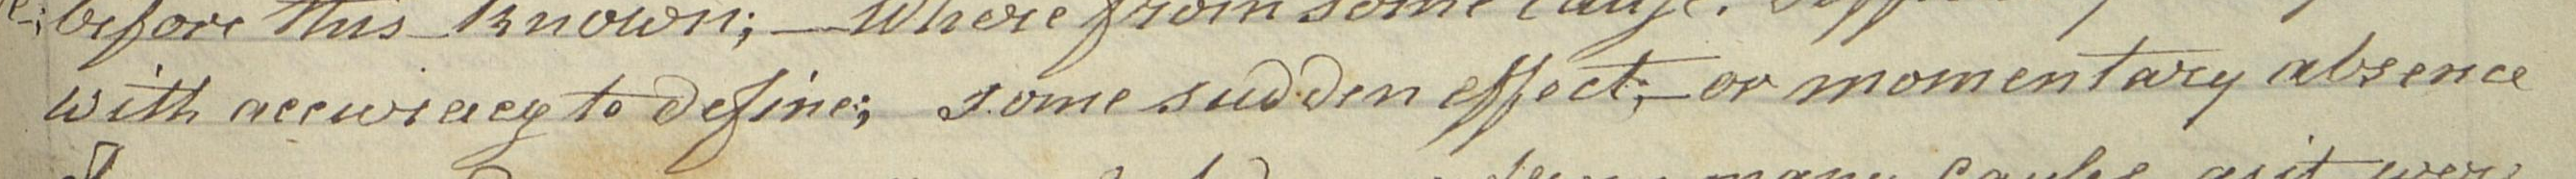with accuracy to define; some sudden effect; or momentary absence
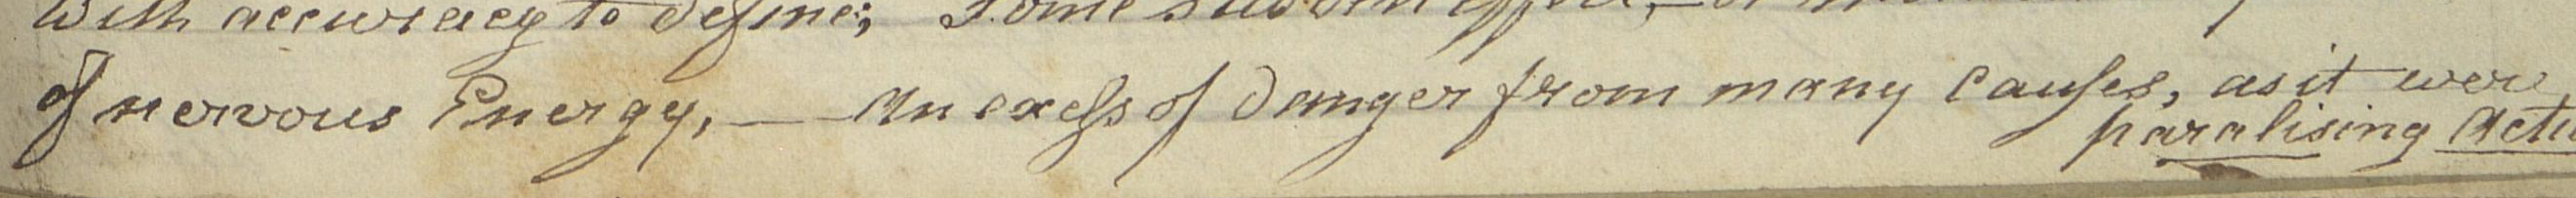of nervous Energy, An excess of danger from many causes, as it were
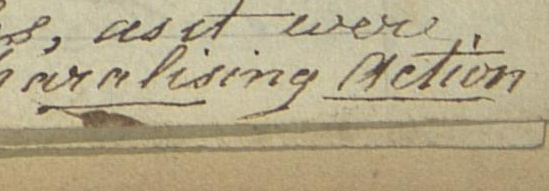paralising action
